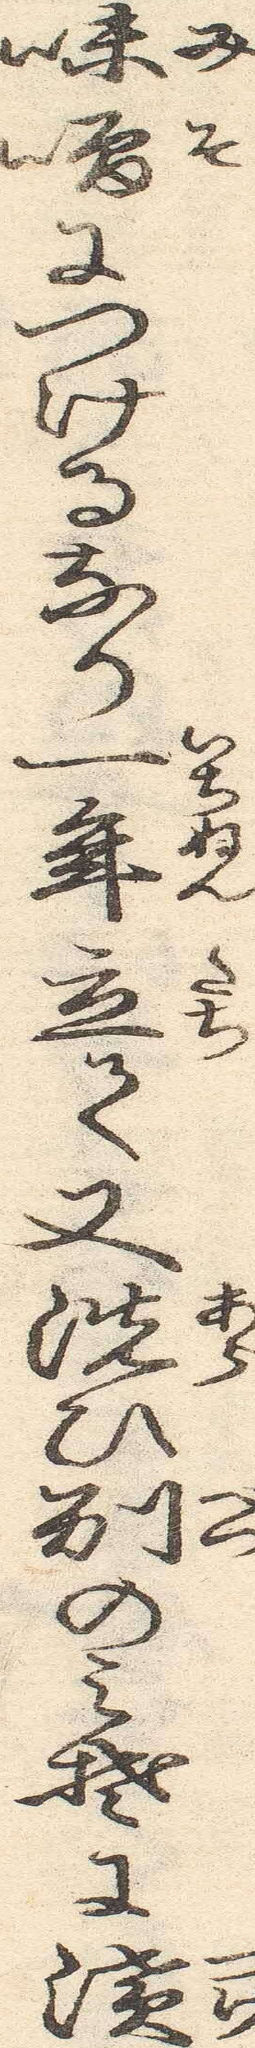味噌につけるなり一年立て又洗ひ別のみそに漬
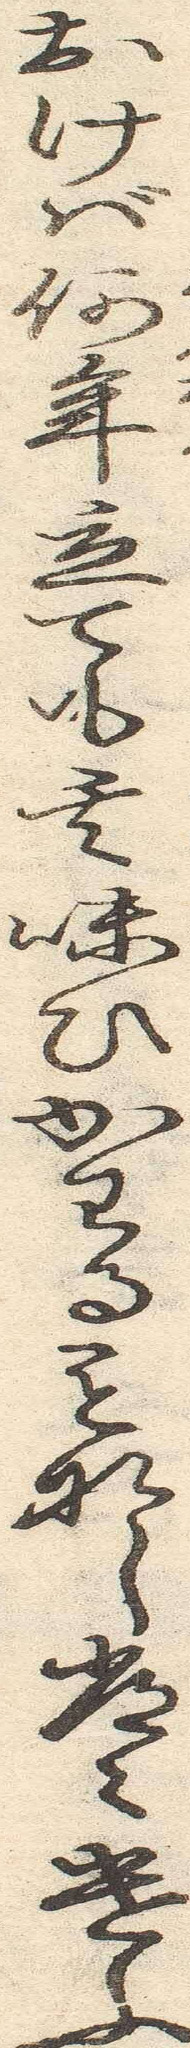おけば何年立ても其味ひかわることなし常々遣ふ
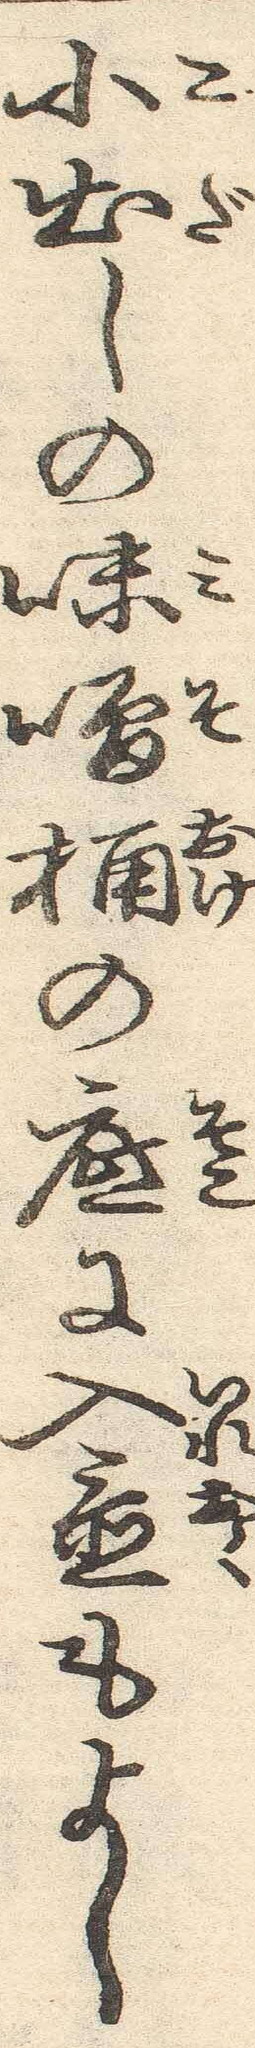小出しの味噌桶の底に入置もよし
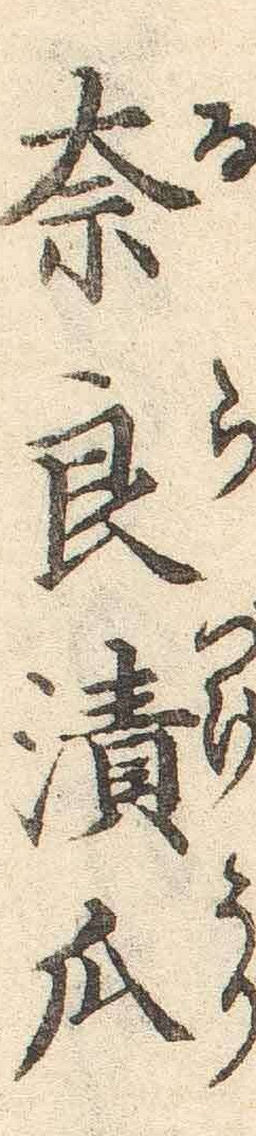奈良漬瓜
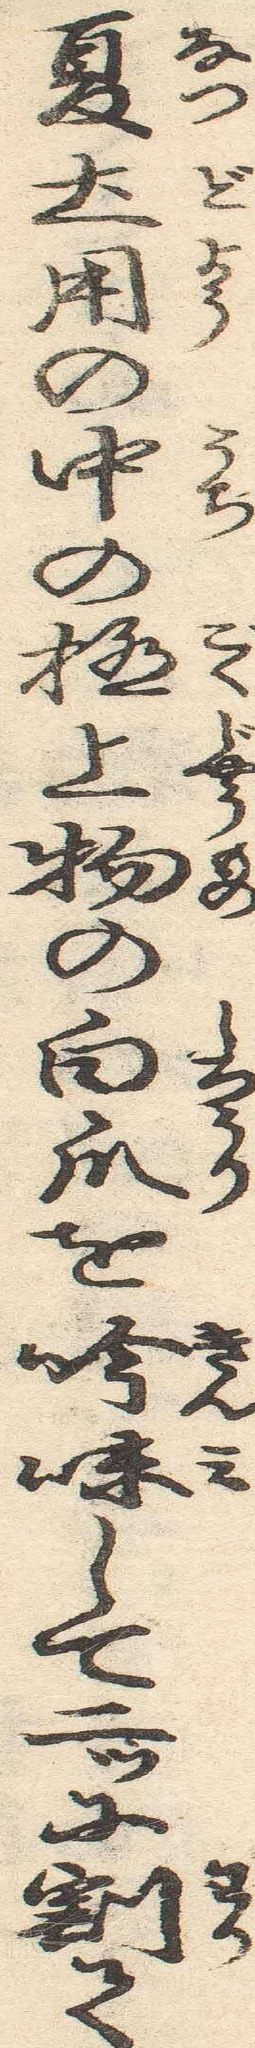夏土用の中の極上物の白瓜を吟味して二ッに割て
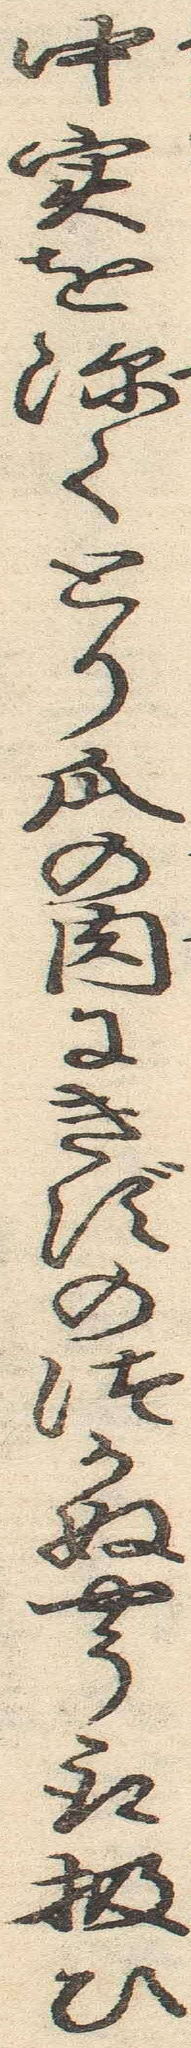中実を深くとり瓜の肉にきずのつかぬやう取扱ひ

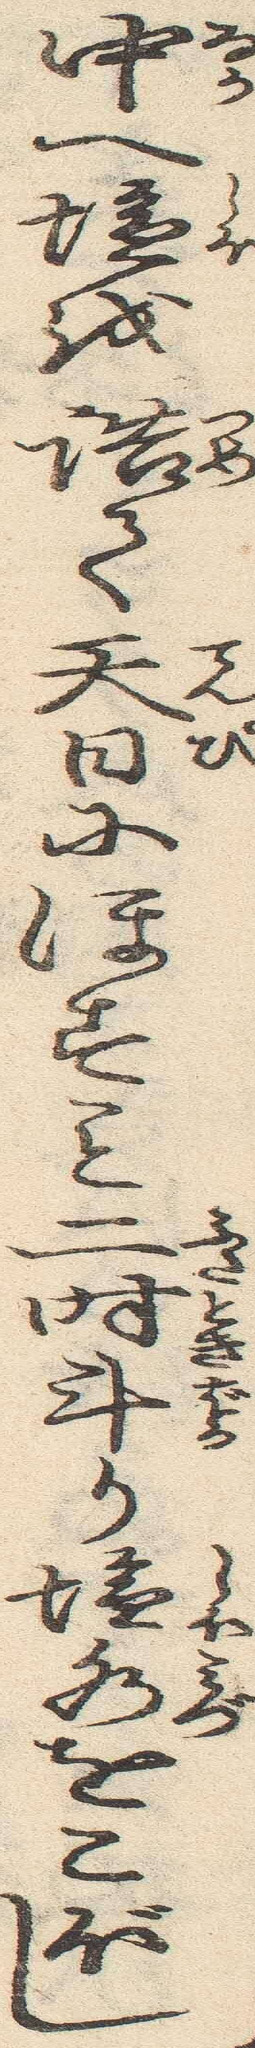中へ塩を詰て天日にほすこと二時斗り塩水をこぼし
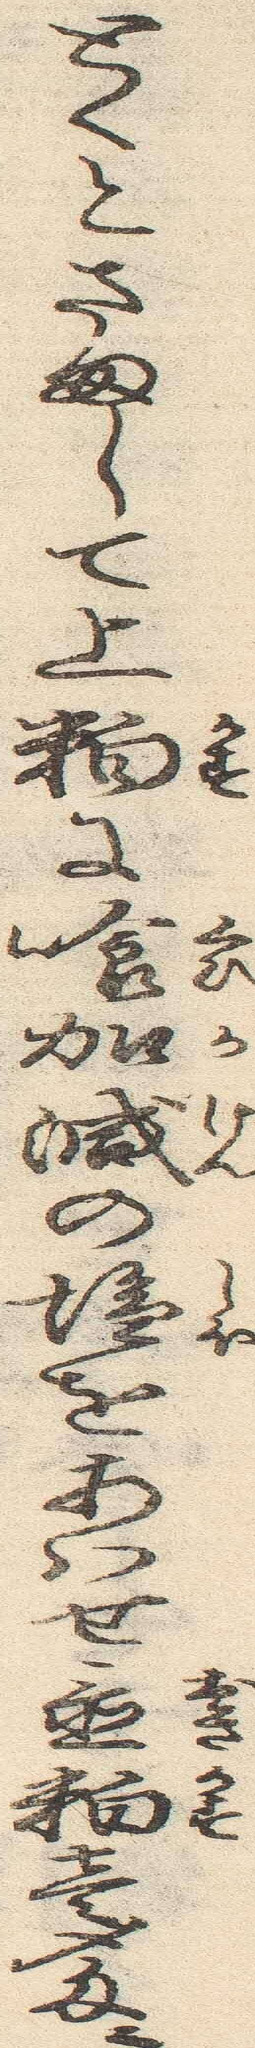とくとさまして上粕に喰加減の塩をあはせ置粕壱貫匁に
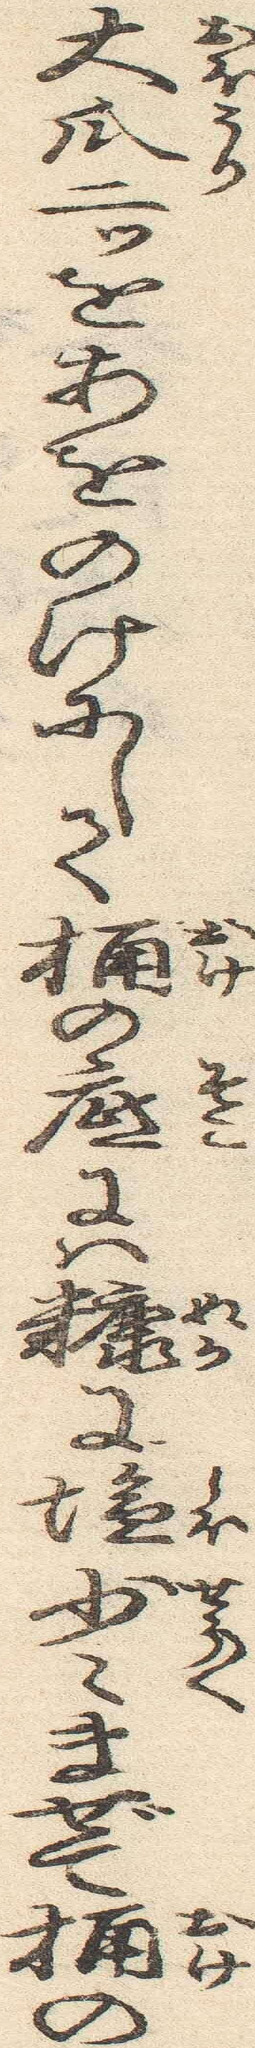大瓜二ッをあをのけにして桶を底には糠に塩少々まぜて桶の
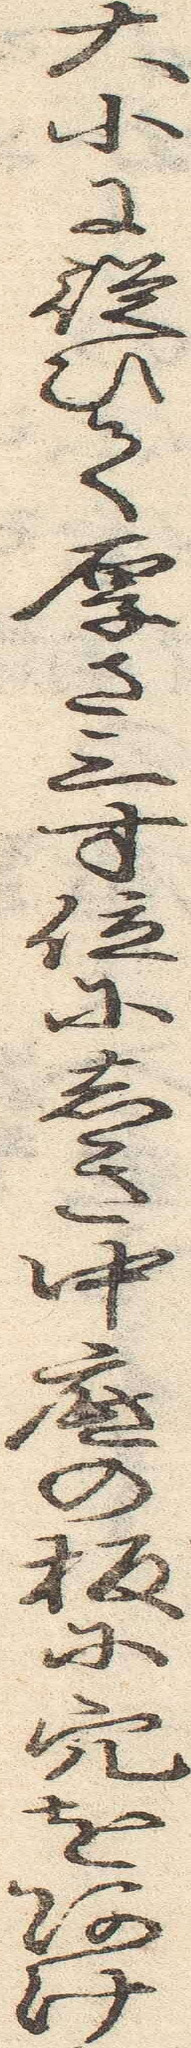大小に従ひて厚さ三寸位にしき中底の板に穴をあけ
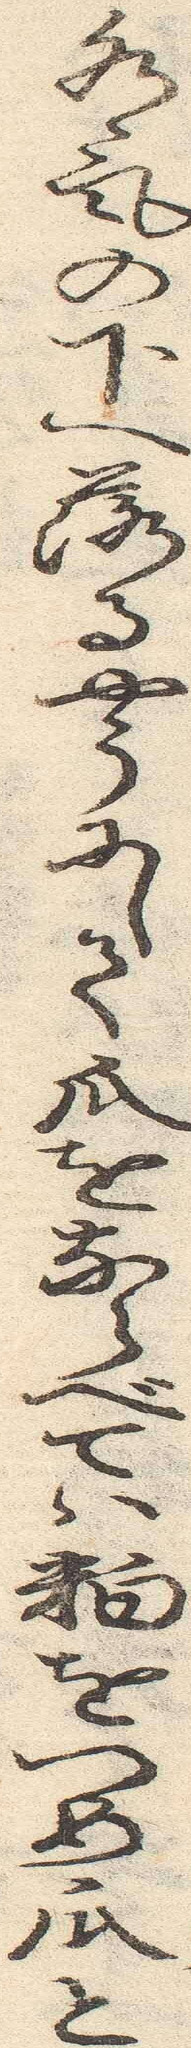水気の下へ落るやうにして瓜をならべては粕をつめ瓜と
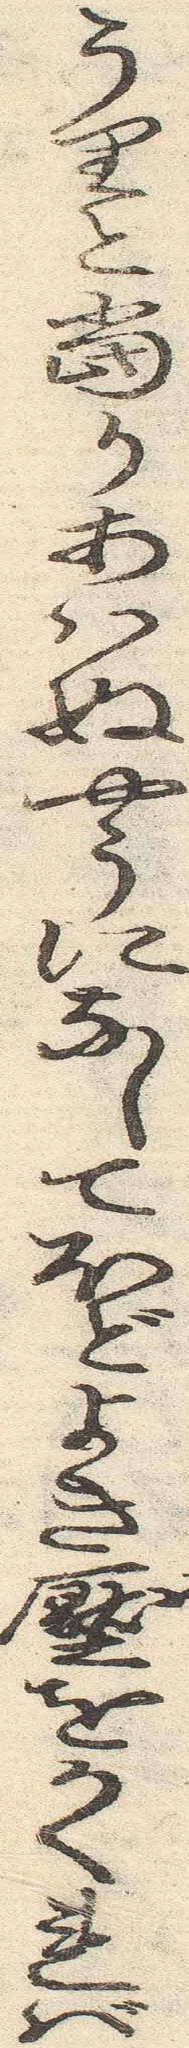うりと当りあはぬやうになしてほどよき圧をかくれば
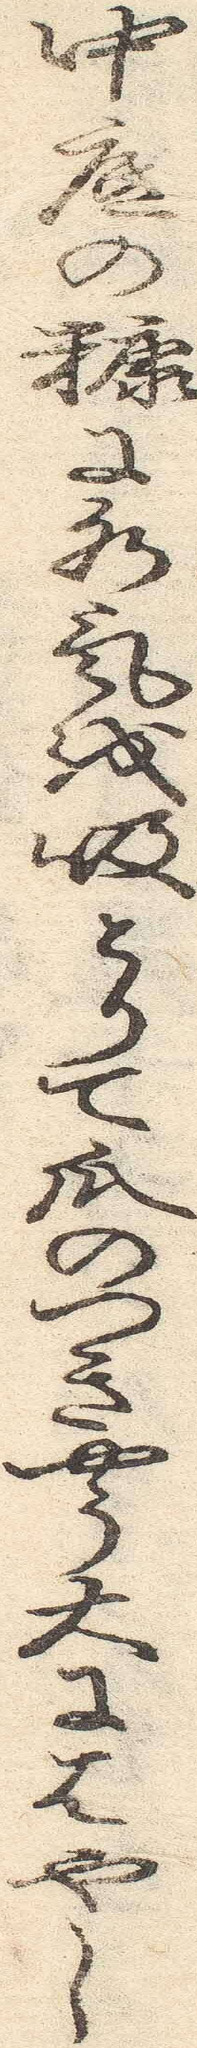中底の糠に水気を吸とりて瓜のつきやう大にはやし
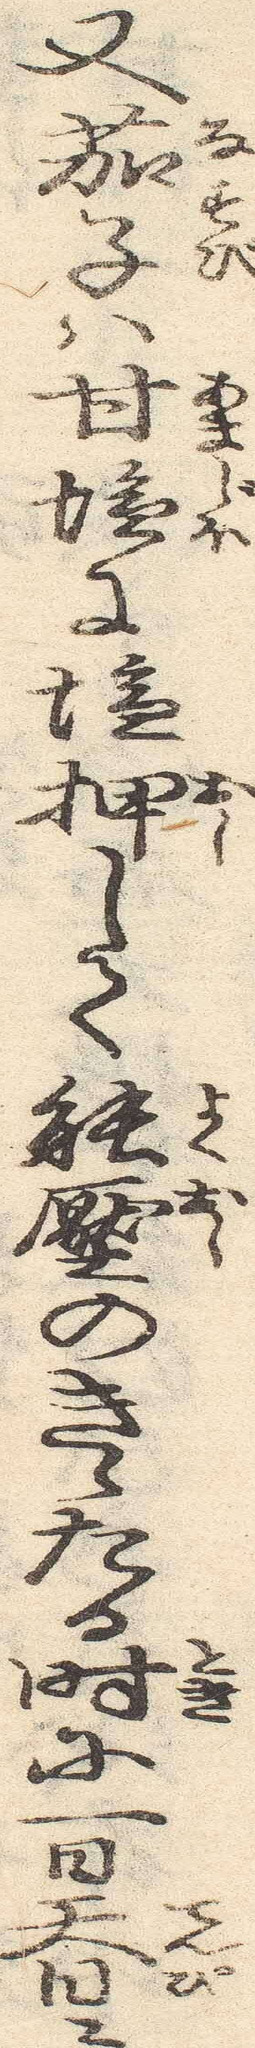又茄子は甘塩に塩押して能圧のきゝたる時に一日天日に
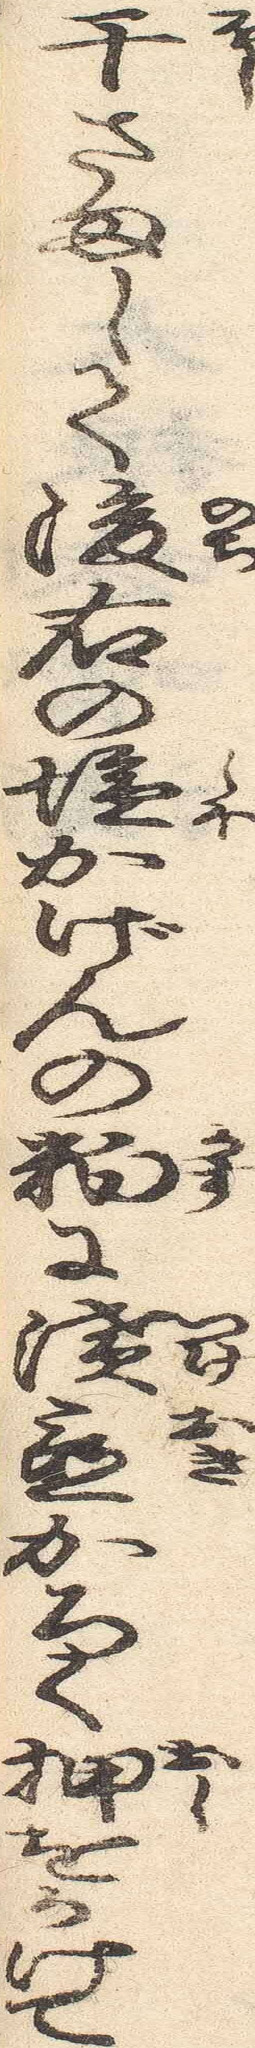干さまして後右の塩かげんの粕に漬置かろく押をかけて
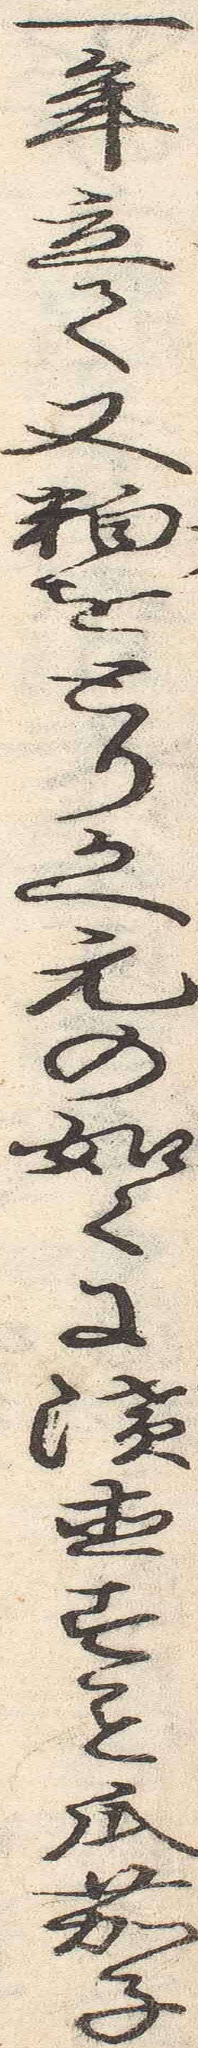一年立て又粕をとりかへ元の如くに漬直すこと瓜茄子
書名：四季漬物塩嘉言
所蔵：東京学芸大学附属図書館 国文学研究資料館
